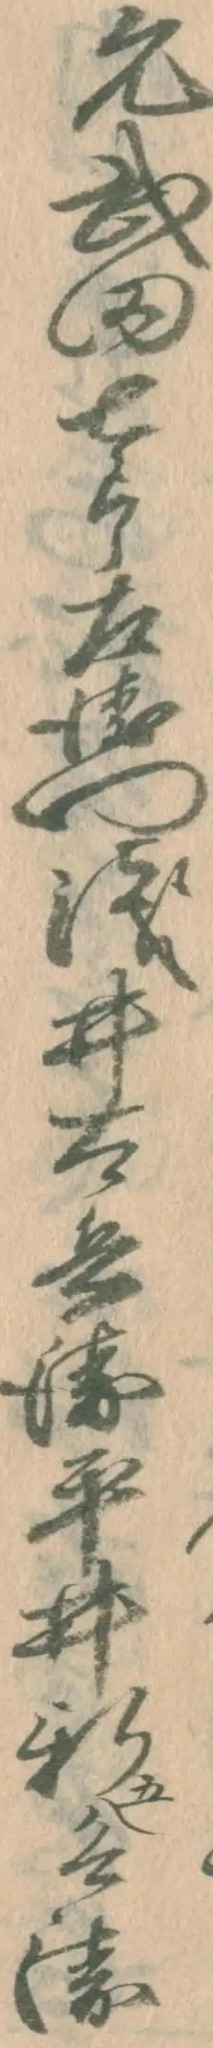允武田七郎左衛門浅井太兵衛平井新五兵衛

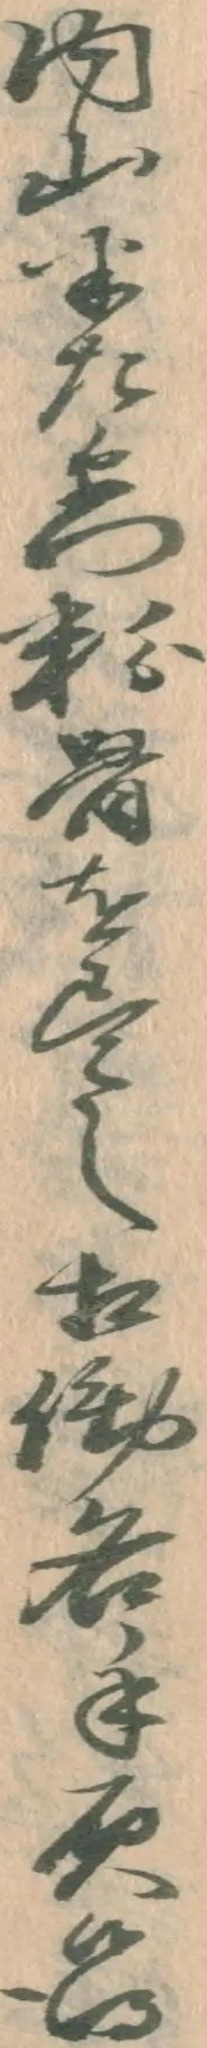内山半左衛門粉骨を尽し相働各手負候得
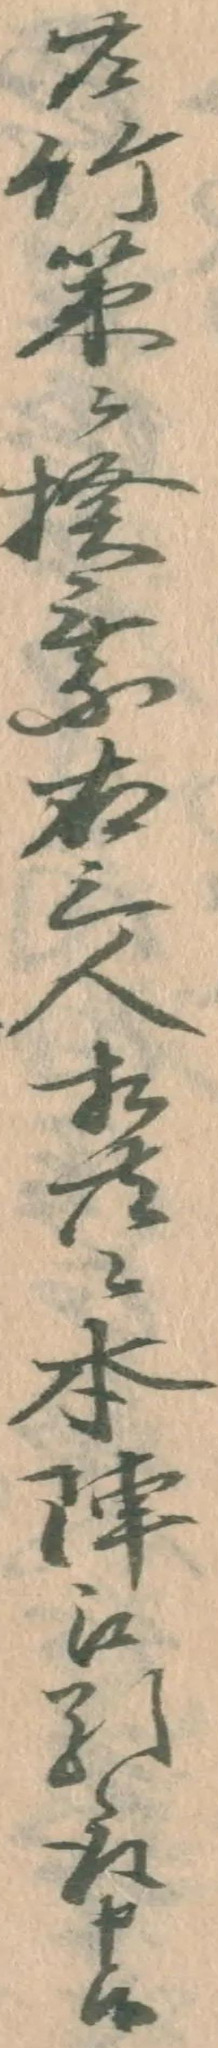共竹束に捨乗右三人相共に本陣江引取申候
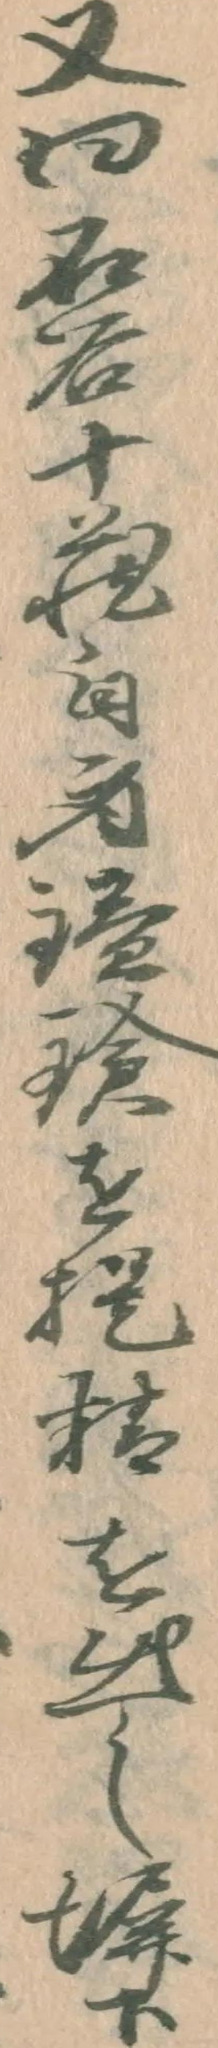又曰石谷十蔵自身鎧鎗を提精を出し塀下
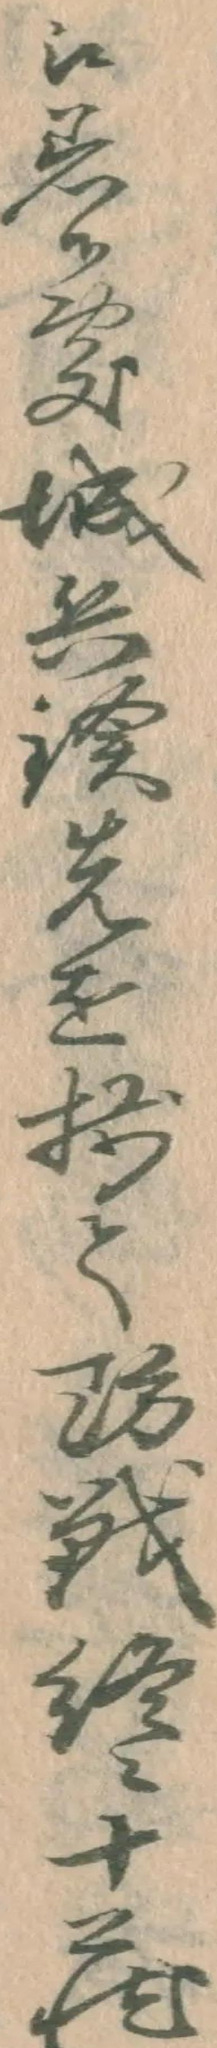江着候處城兵鎗先を揃て防戦終に十蔵
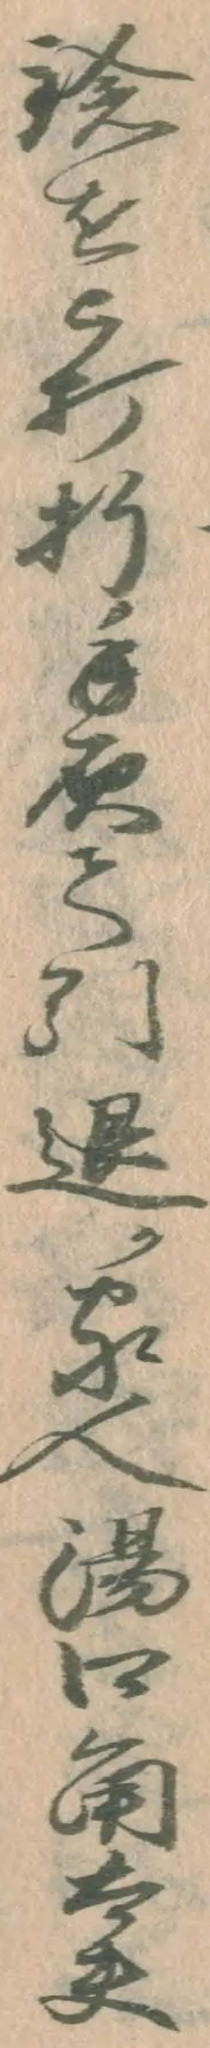鎗を被打折手負て引退く家人湯口角太夫
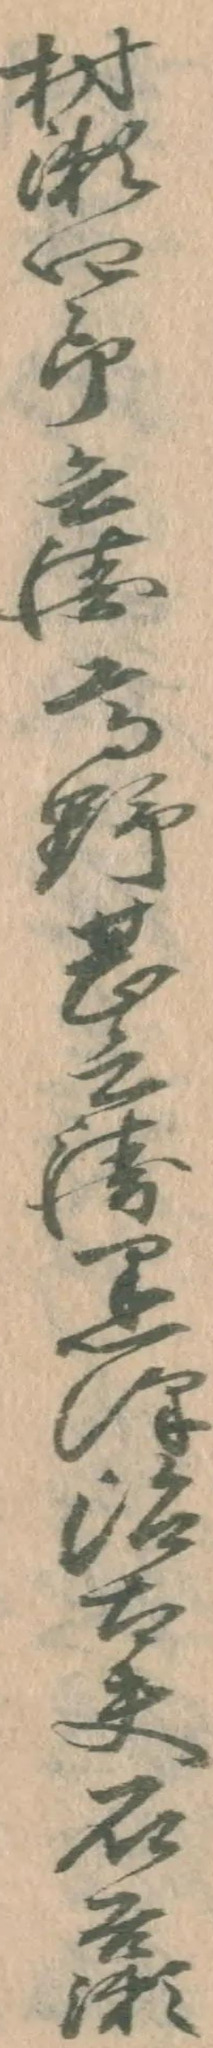村瀬四郎兵衛高野甚兵衛黒沢治太夫石谷瀬
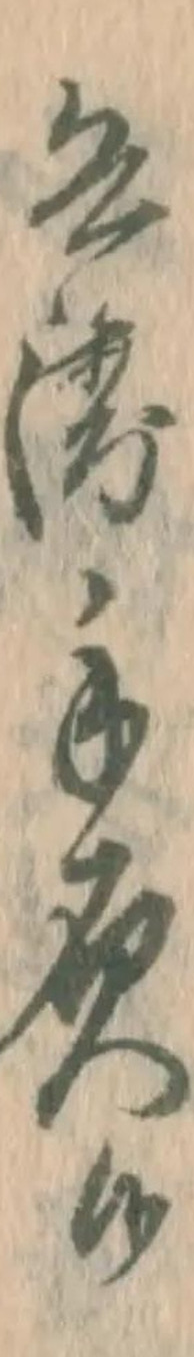兵衛手負候
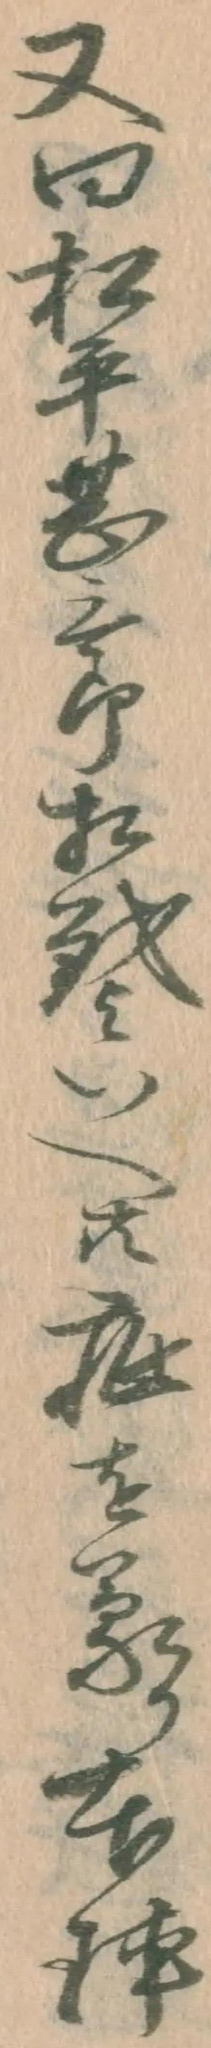又曰松平甚三郎相戦与いへ共疵を承り本陣
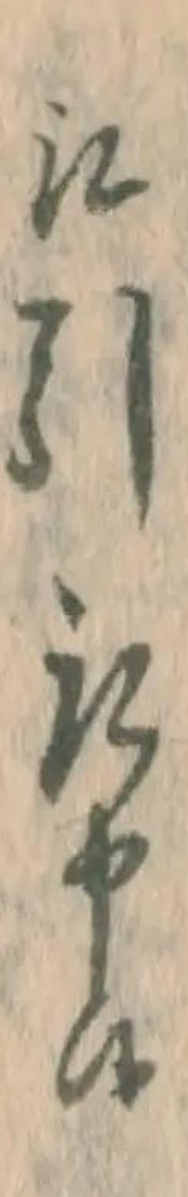江引取申候
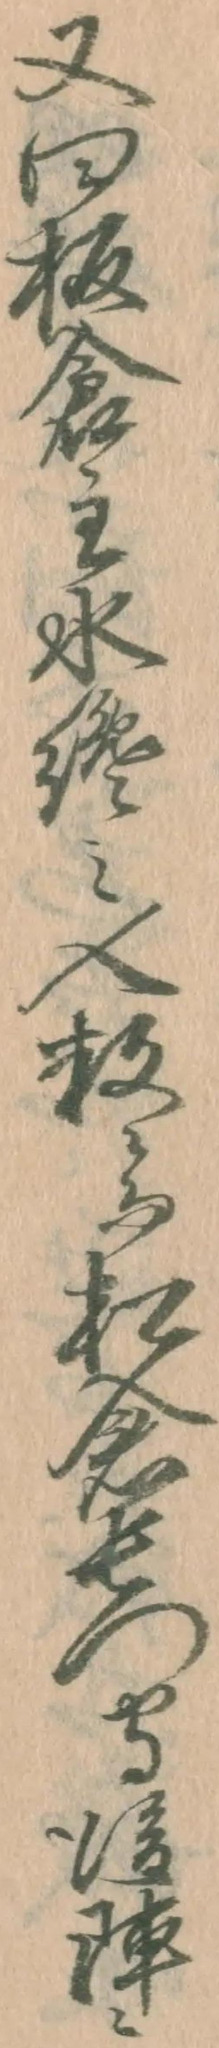又曰板倉主水纔之人数に而松倉長門守後陣に
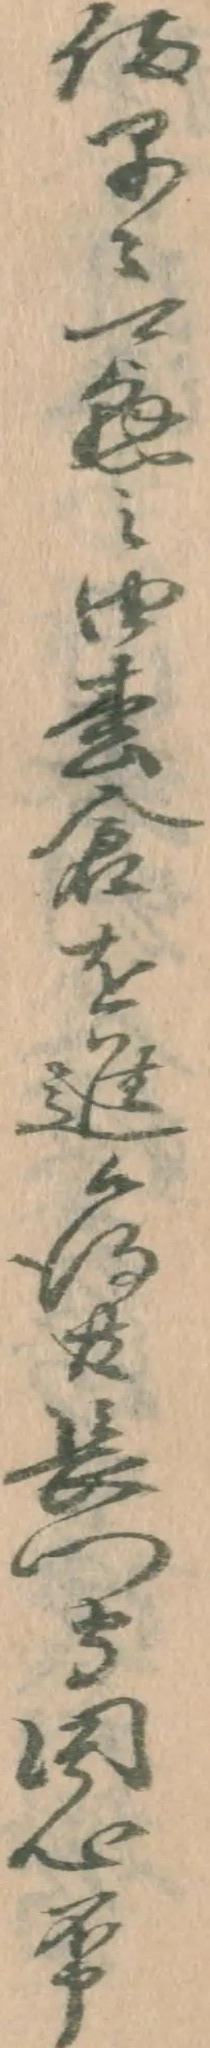備早々可懸之由枩倉を進候得共長門守用心不申
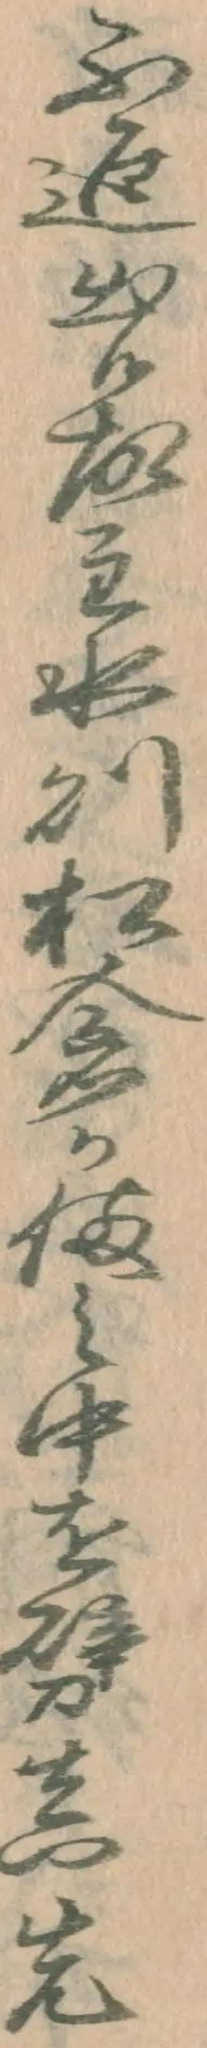ふ進出候故主水則松倉か備之中を劈真先
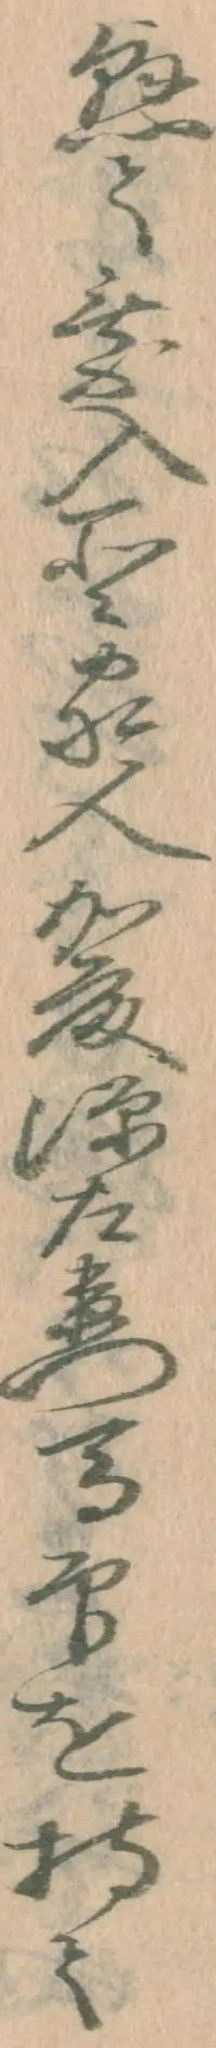懸て乗入所に家人加藤源左衛門馬印を持て
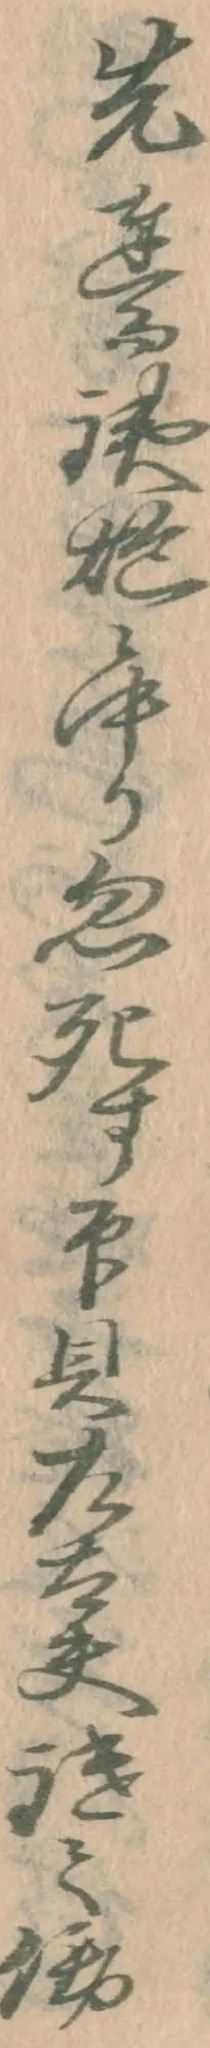先達而鉄炮に中り忽死す印貝左太夫鑓て働
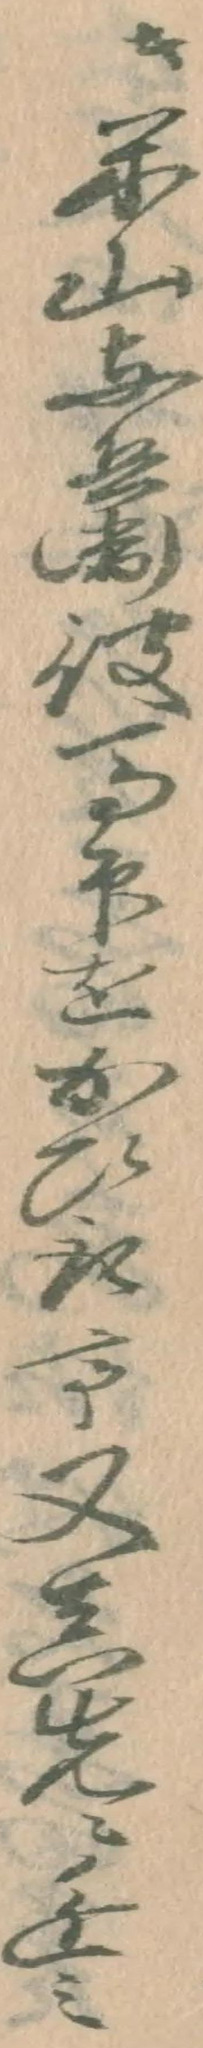き米山与兵衛彼馬印をかひ取亭又真先に進み
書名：切支丹御退治記 49巻. [5]
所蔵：国立国会図書館 National Diet Library, JAPAN
